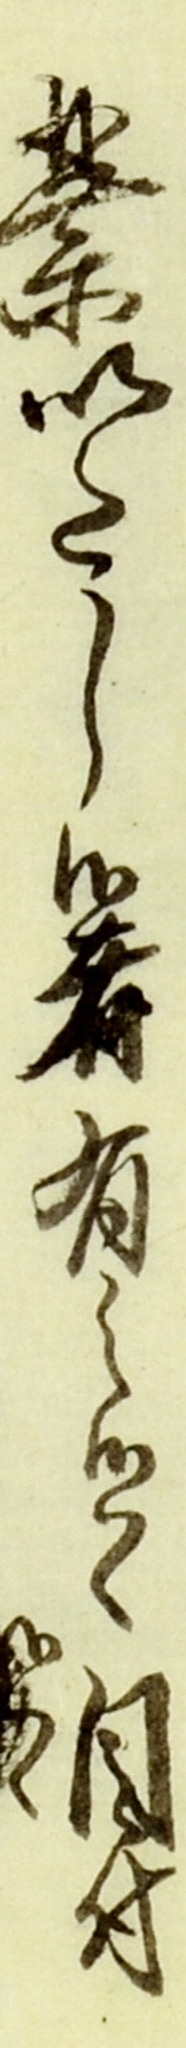業いたし候者有之候ハゝ目付
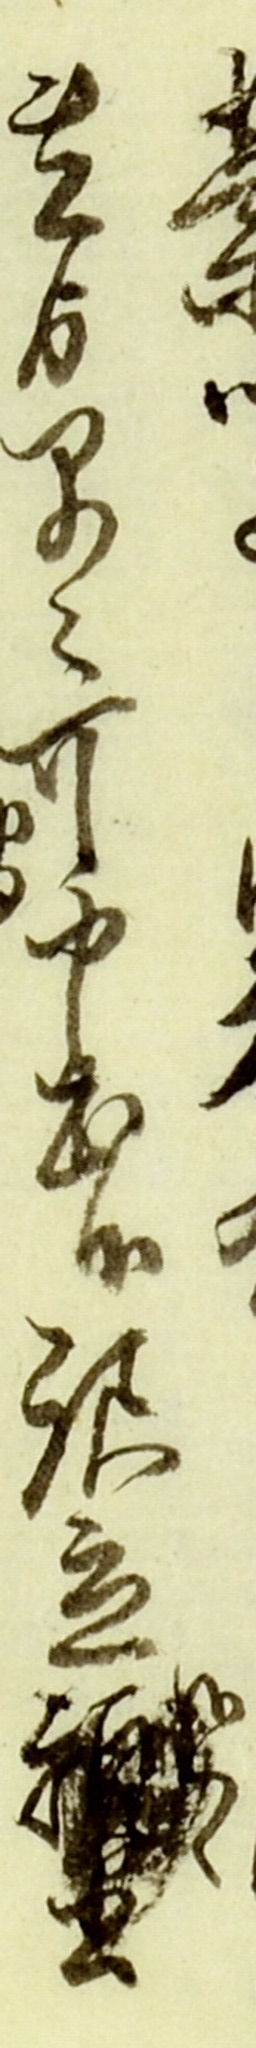共ゟ早々可申出候訳立候ハゝ
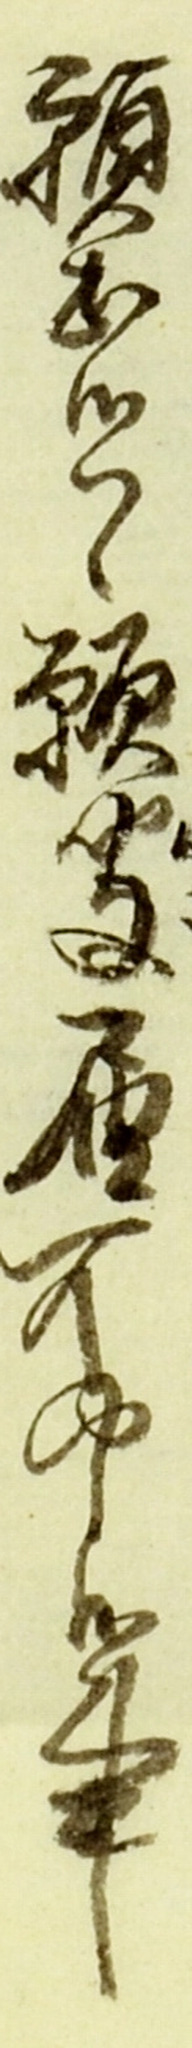願出候ハゝ願聞届可申候事
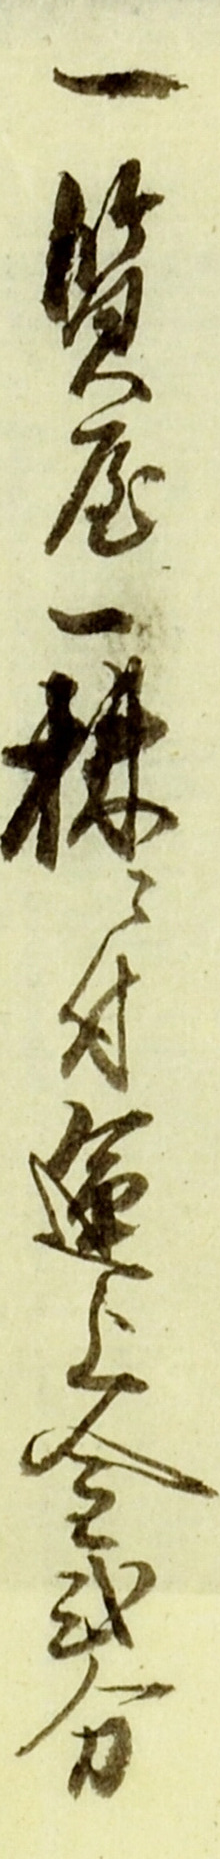一質屋一株ニ付運上金弐分
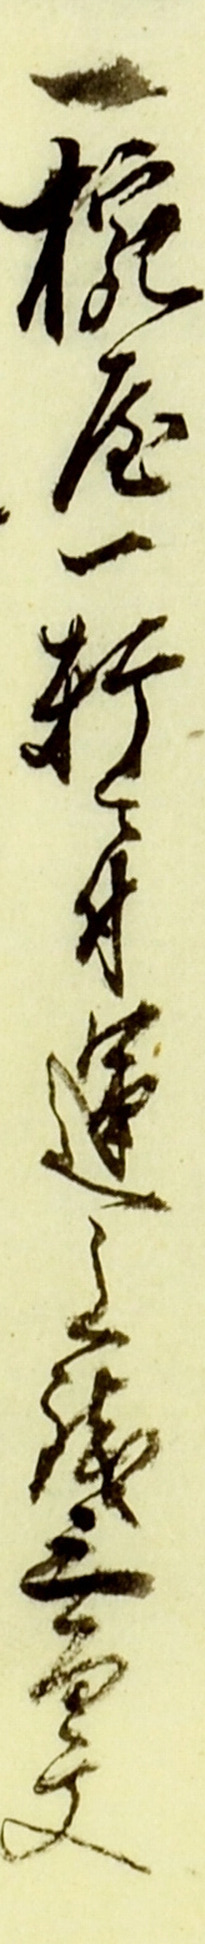一椀屋一軒ニ付運上銭三百文
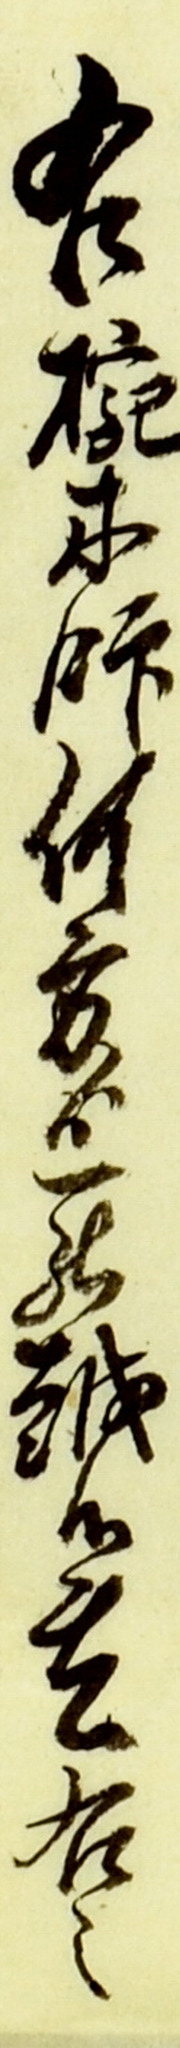右椀木師何方ゟ罷越候共右之
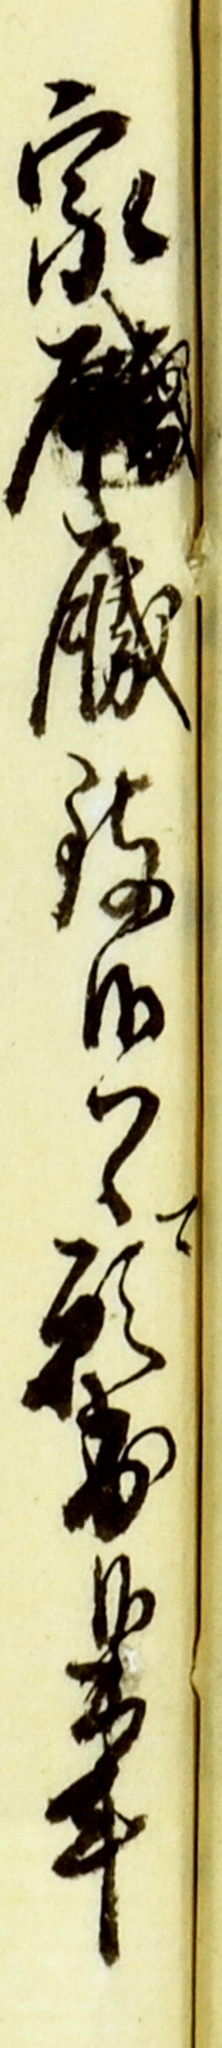家職致候ハゝ願出候事
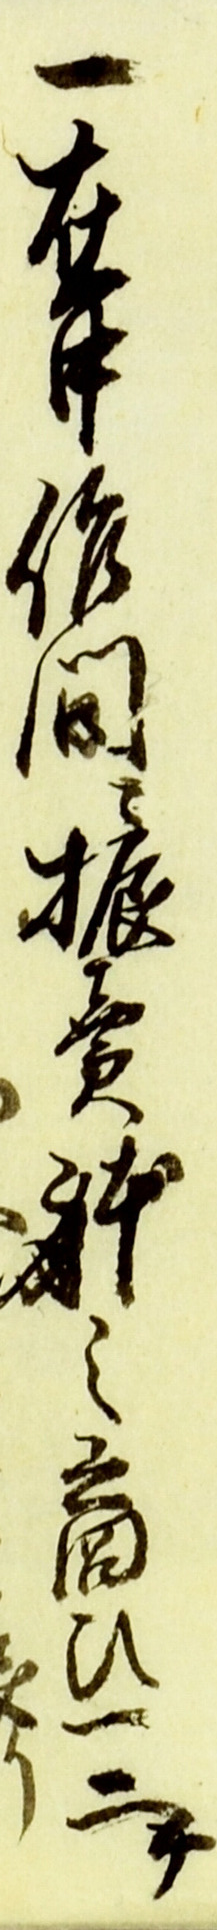一在中作間ニ振売躰之商ひ一二ケ
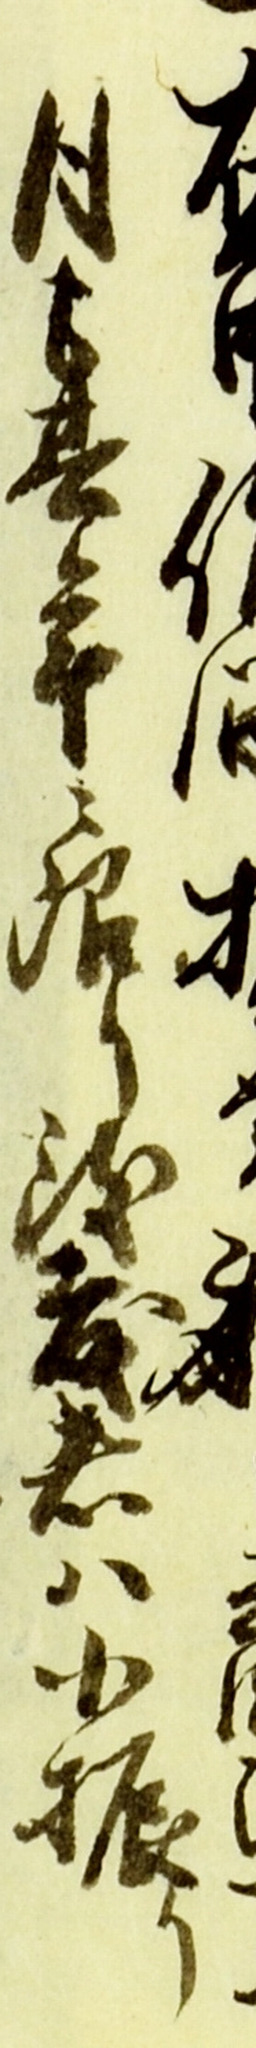月ゟ其年ニ限り致度者ハ小振り
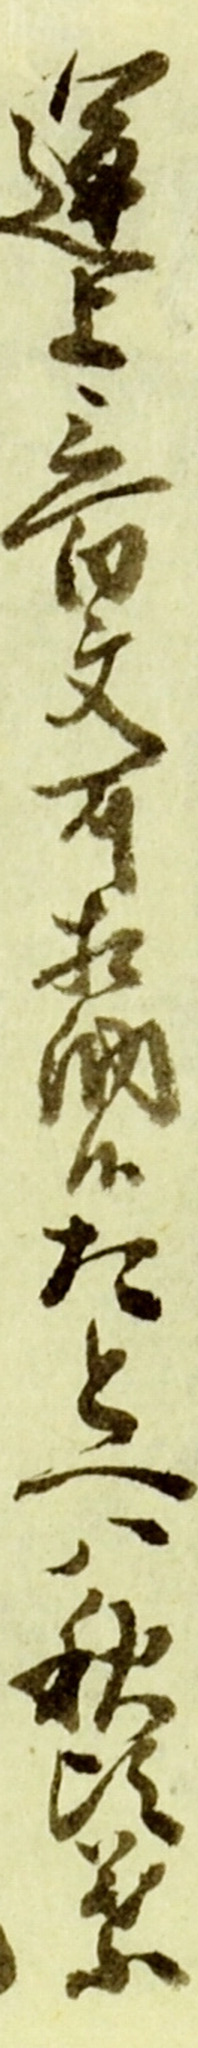運上三百文可相納候たとへハ秋頃葉
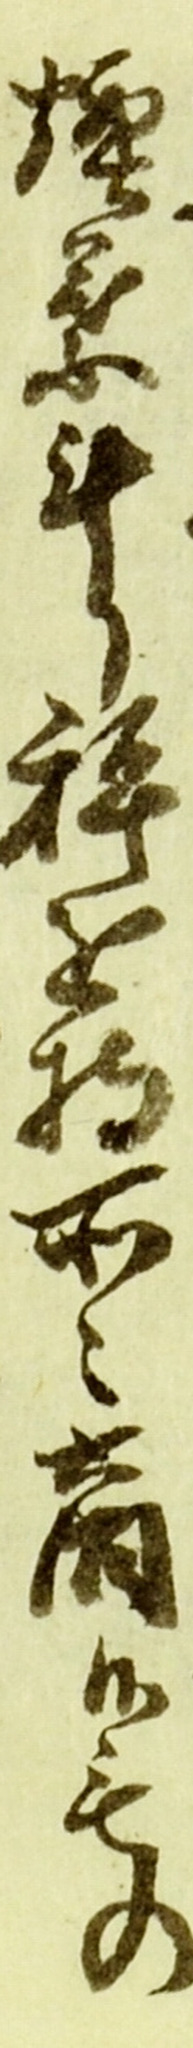煙葉斗り秤を持所々商候もの
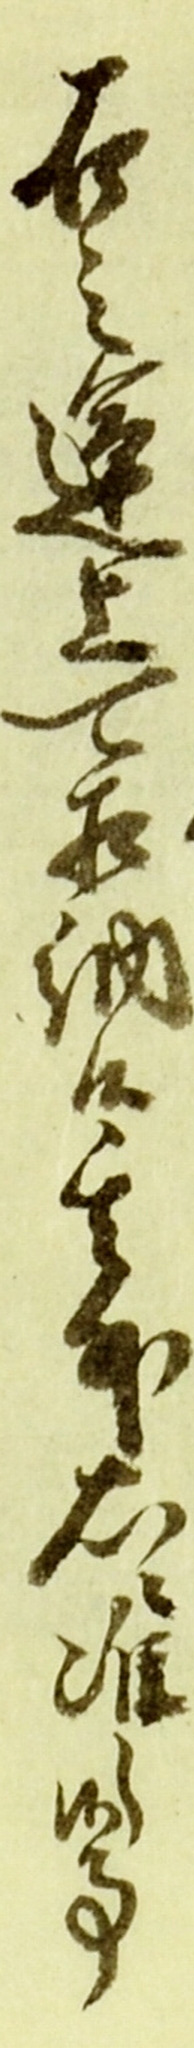右之運上可相納候其外右ニ准し候事
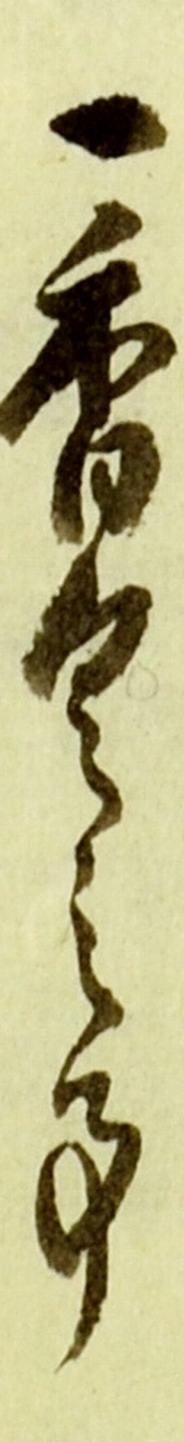一香具之事
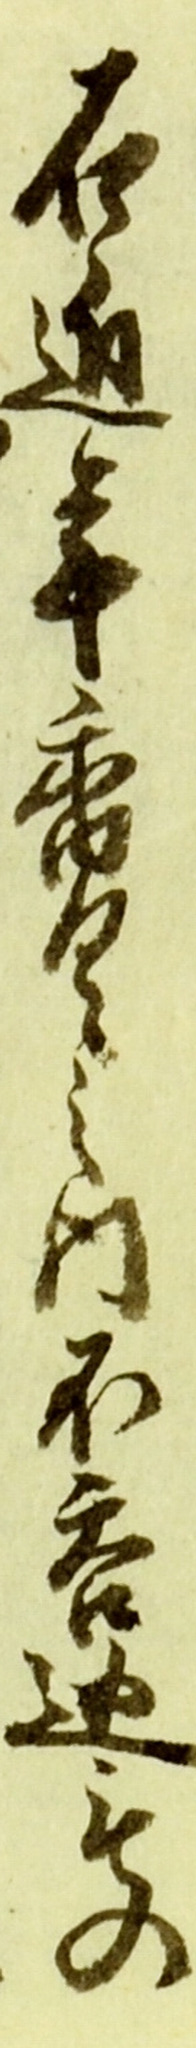右近年香具之内不呑込もの
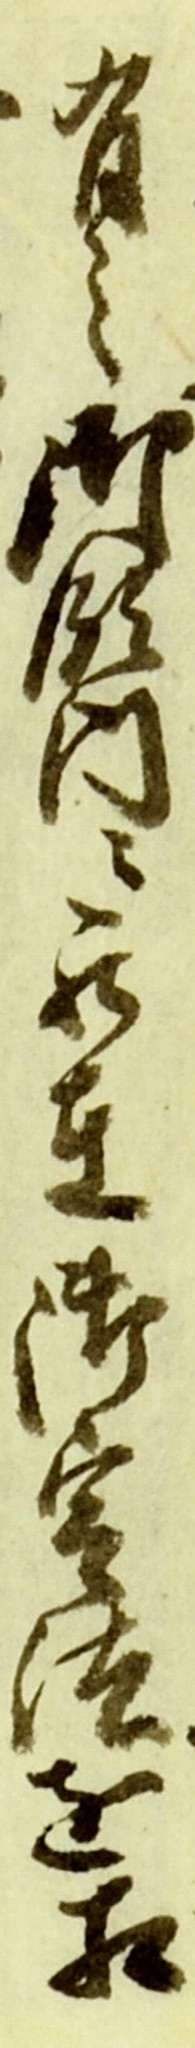有之御領内ニ罷在御定法を相
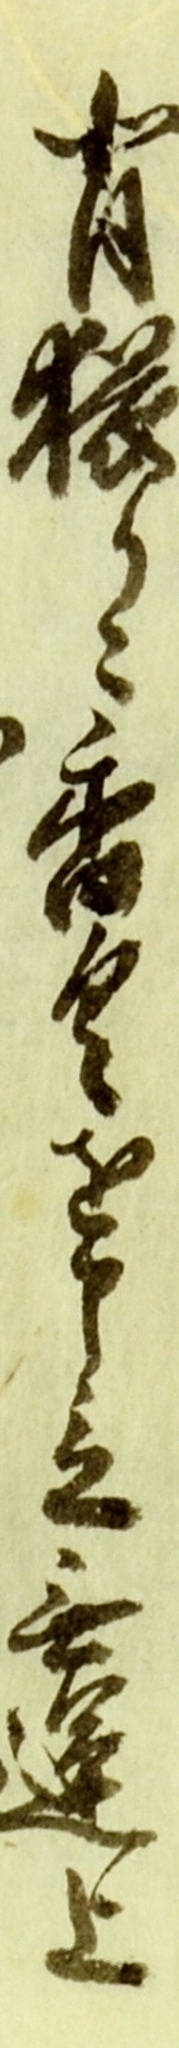瀬背猥りニ香具を申立無運上
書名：分一方諸運上御定法
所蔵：伊那市立高遠町図書館・合同会社AMANE
